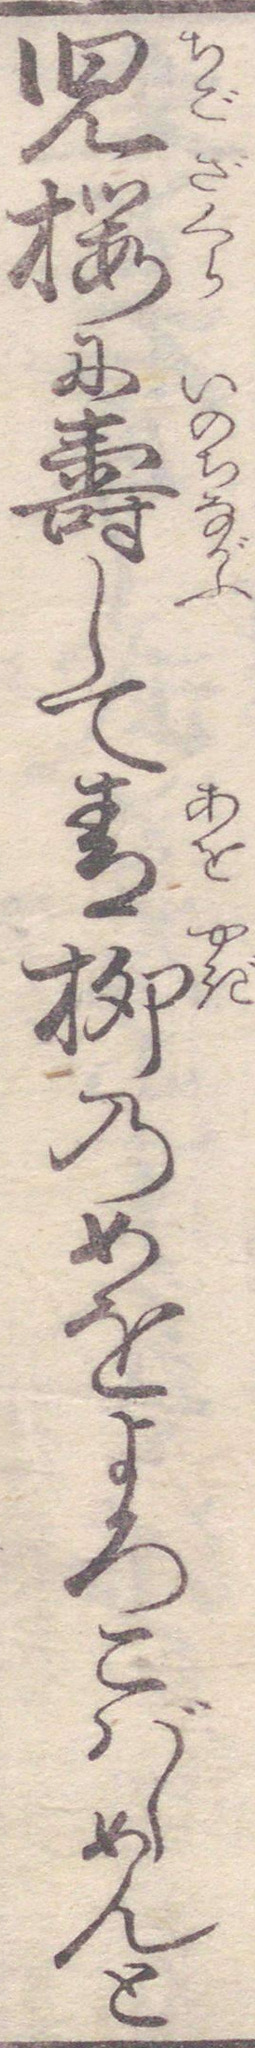児桜に寿して青柳のめをよろこばしめんと
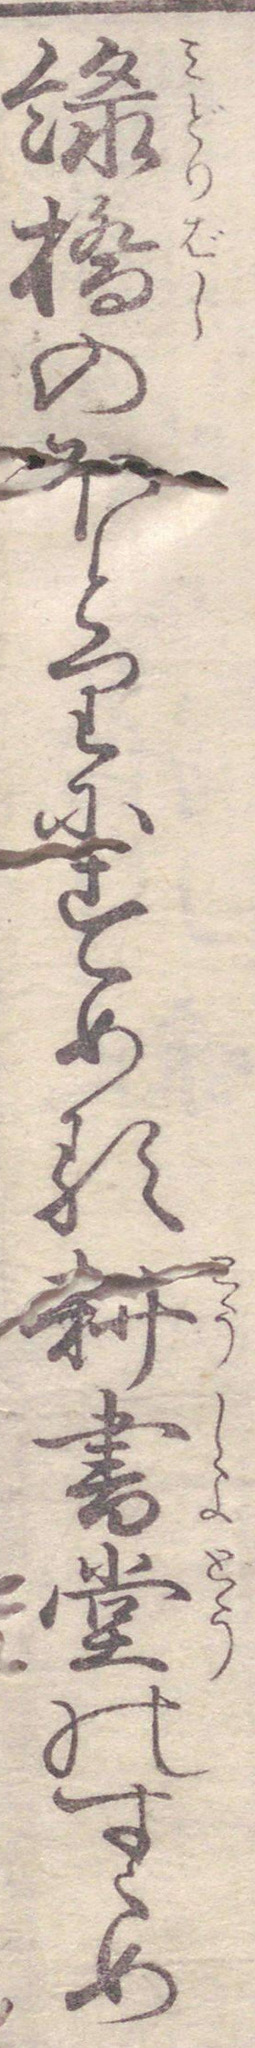緑橋のほとりにすめる耕書堂のすゝめ
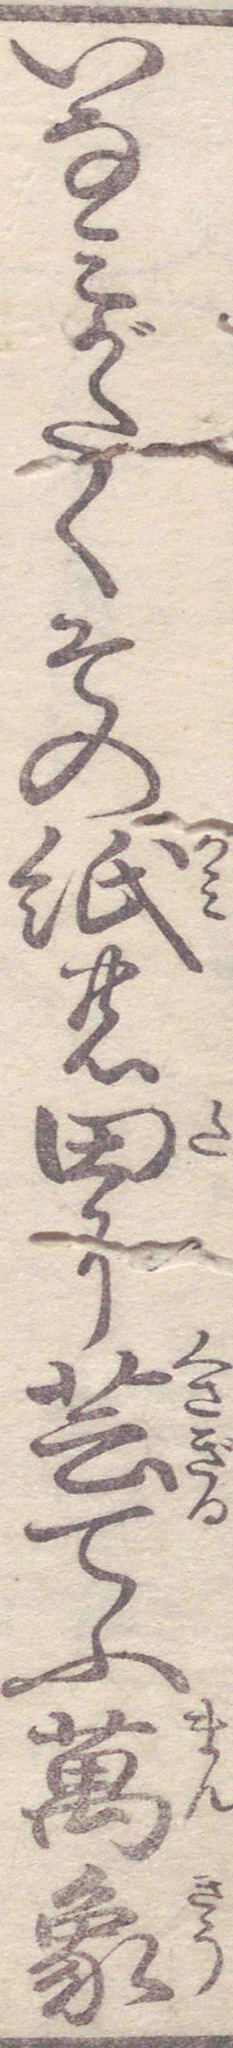いなみがたくその紙の田に芸てふ万象
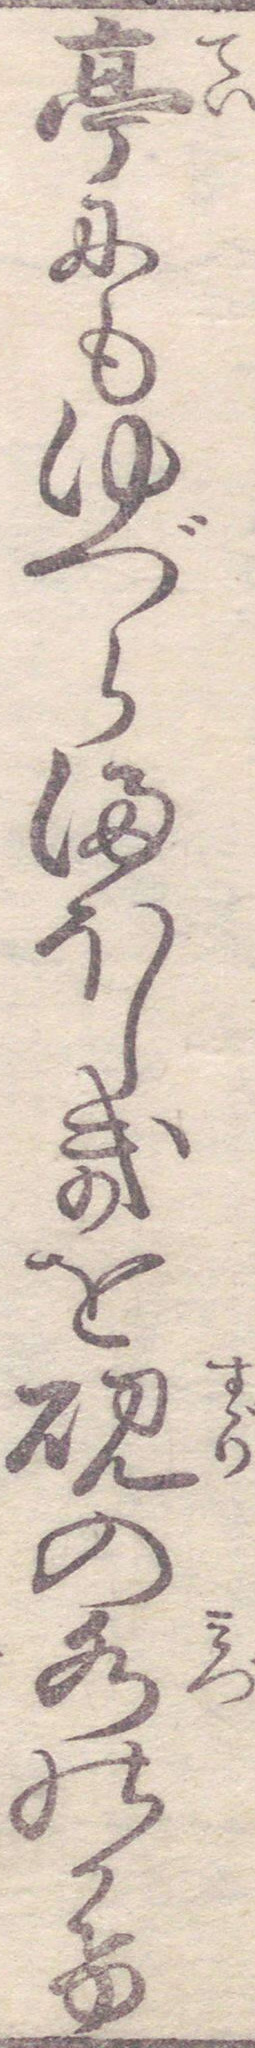亭にもゆづらまほしきを硯の水のかけ
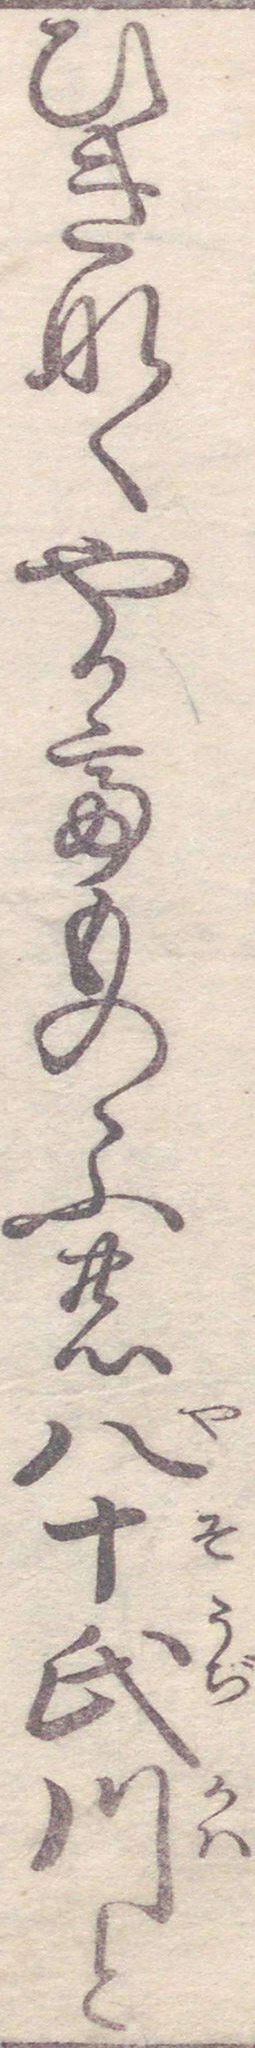ひきなくやかてものゝふの八十氏川と
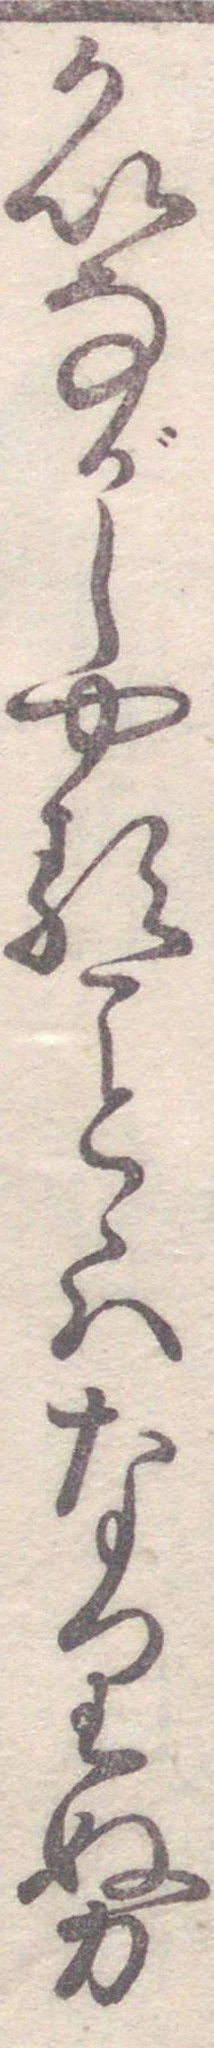かいながしやることゝはなりぬ
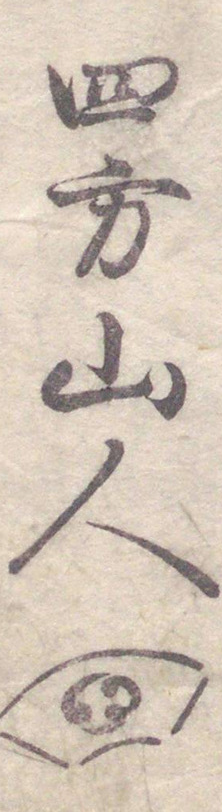四方山人

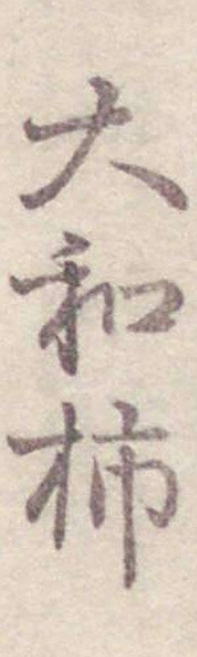大和柿
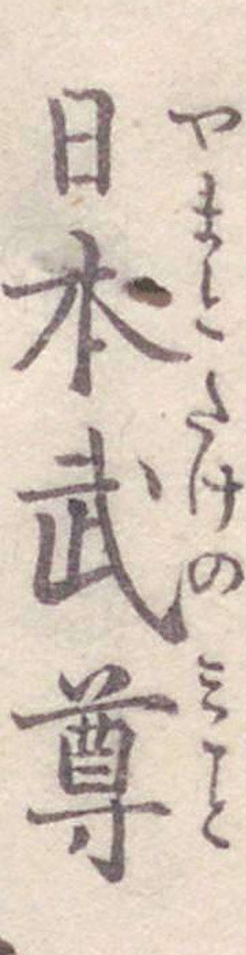日本武尊
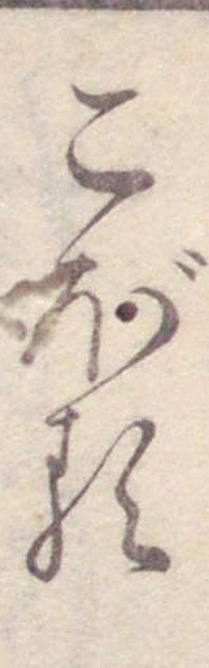こぼる

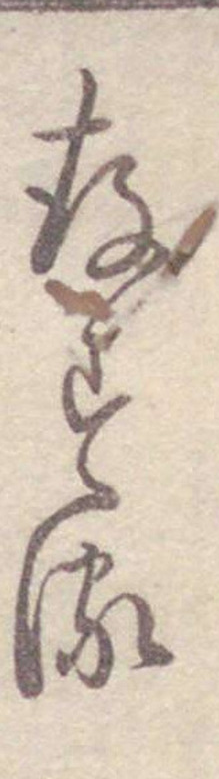存する
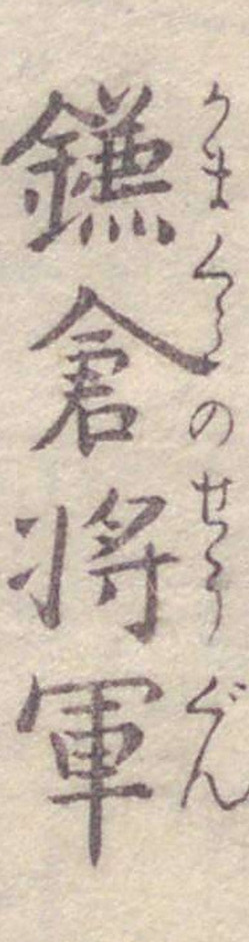鎌倉将軍

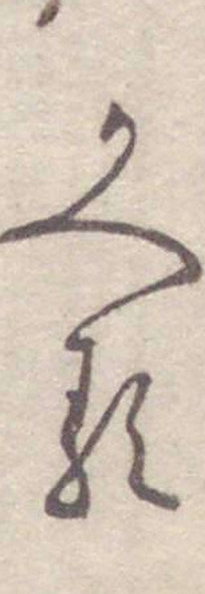かへる
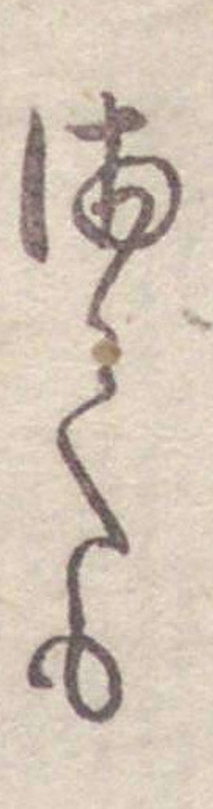まくも
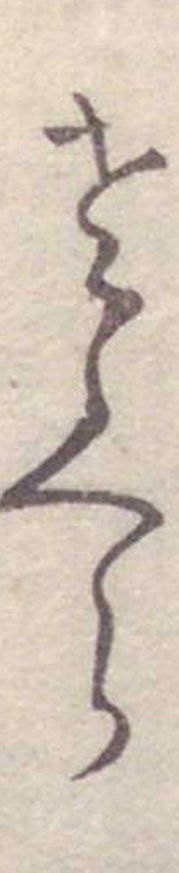さくら
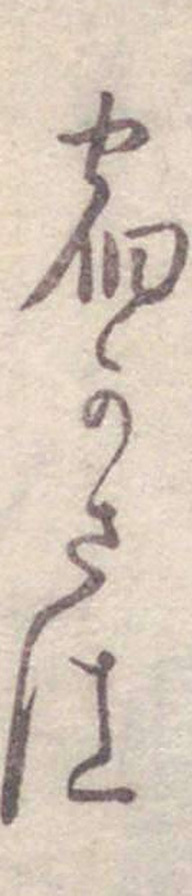宿かさは
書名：繪本八十宇治川
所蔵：九州大学中央図書館 国文学研究資料館
